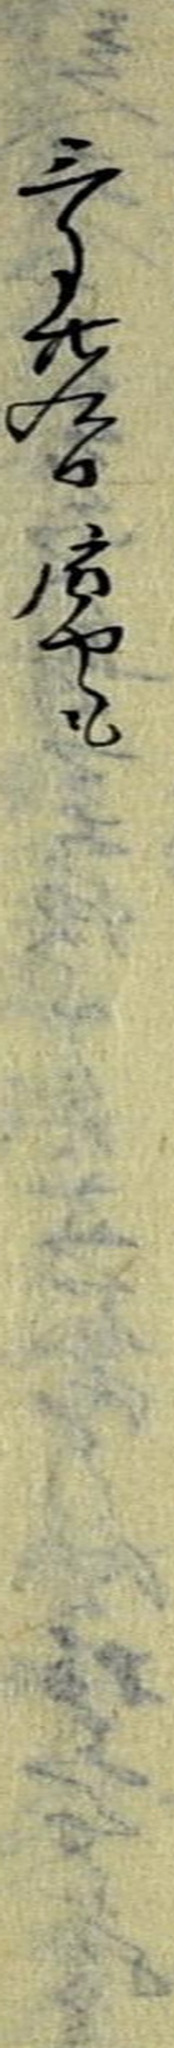三月廿九日府中へも
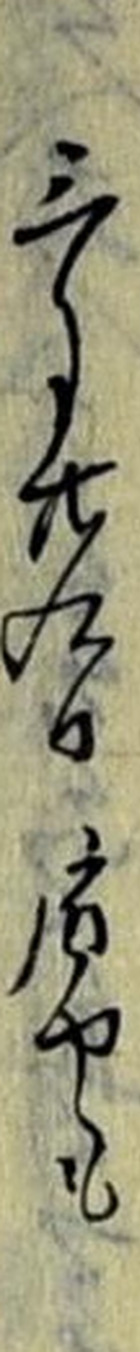三月廿九日府中へも
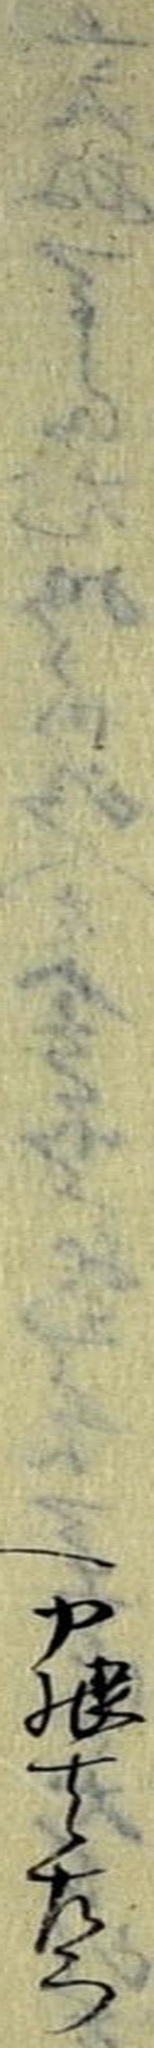中根十郎左衛門
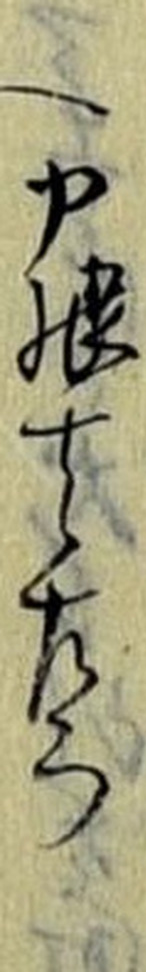中根十郎左衛門
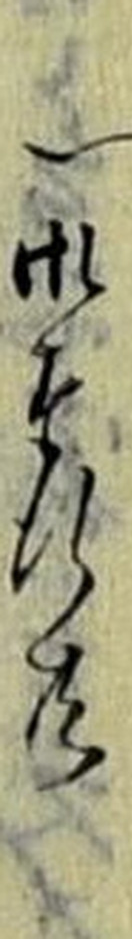御奉行共
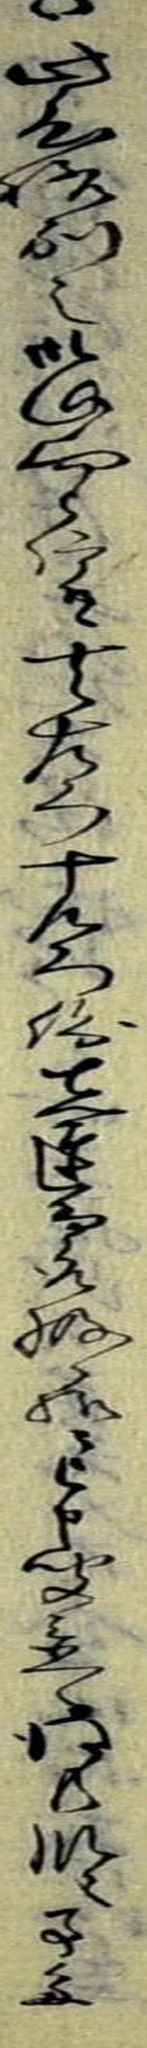〇此度格別之御趣向被仰出候十郎左衛門十左衛門儀先達而取扱候様に被申聞置候得共段々事多
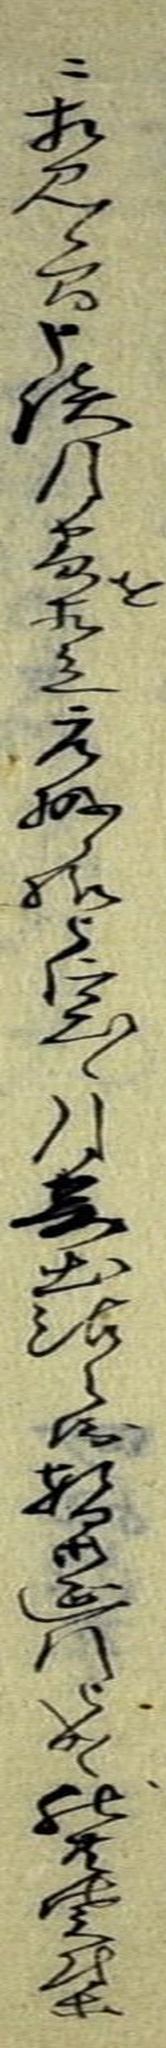に相見候間申談月番を相立取扱候様被仰出候月寄出銀之儀暫御延引被成候然共貸付等
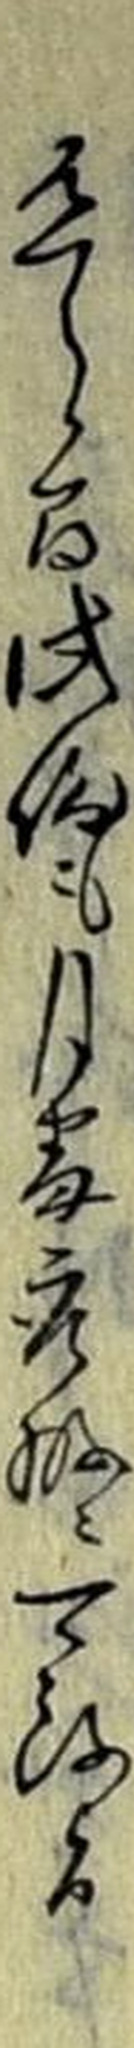有之候間此儀も月番取扱に可致旨
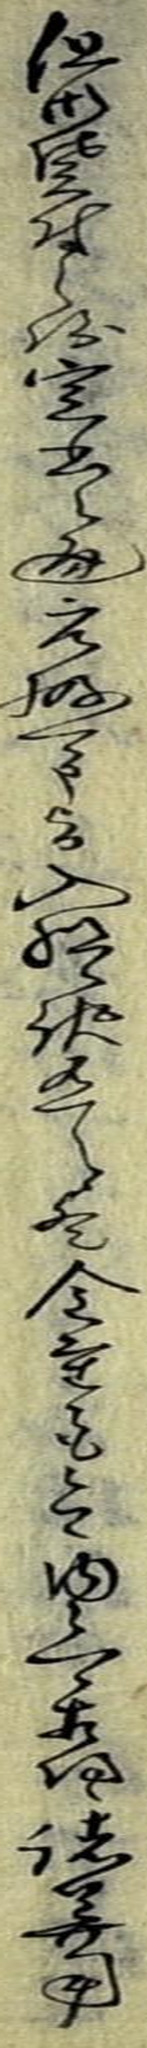但御貸付之儀定書之通取扱可申旨入組候訳有之候歟金重にも候はゝ内に可相伺候諸算用
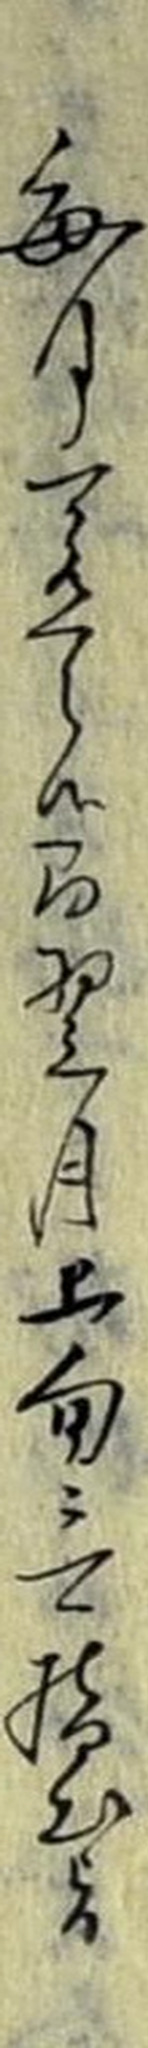毎月可有之候間翌月上旬にて指出旨
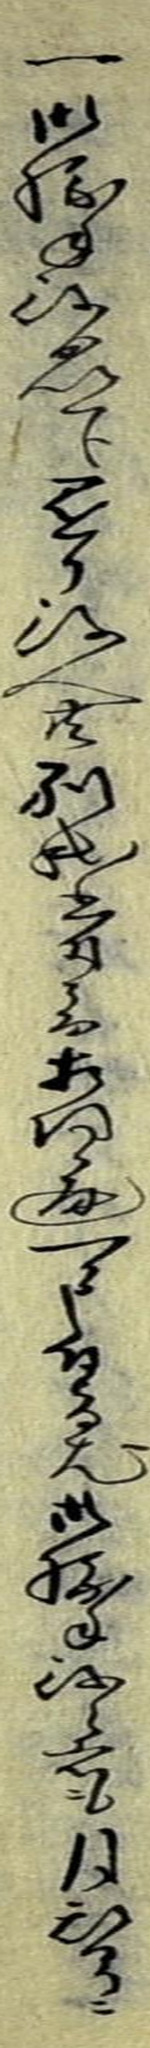一御勝手役ゟ以下懸り役人共別紙書付に而相伺候通可申付旨尤御勝手役之者も月替りに
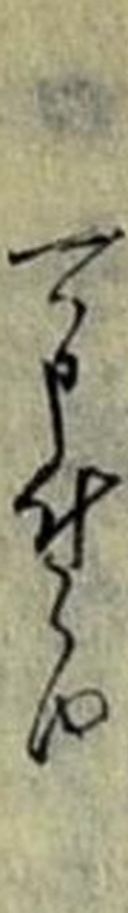可申付候由
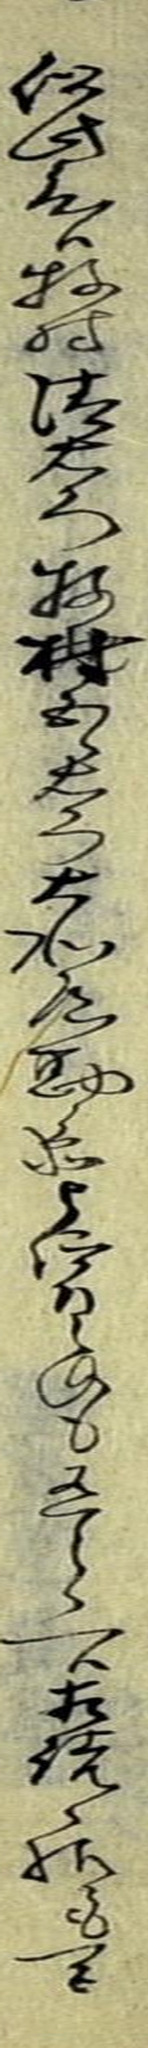但此度は牧村清右衛門牧村五郎右衛門大和屋勘兵衛被仰付候趣も有之候へは相詰候様にも可被
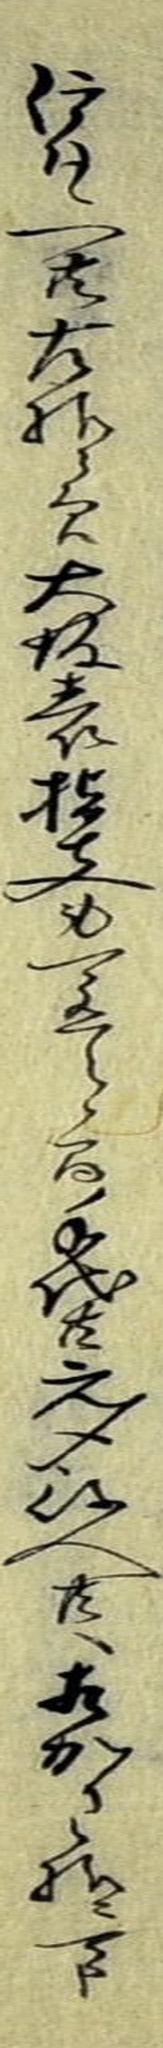仰付候へ共右様に而は大坂表指支も可有之候間手代共元〆役人共へ相加り候様に可申

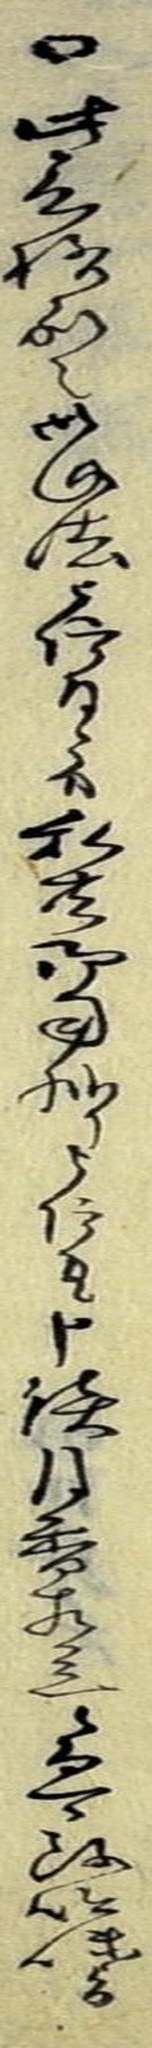〇此度格別之御趣法被仰付候に付私共御用掛り被仰付候申談月番相立候而可致吟味旨
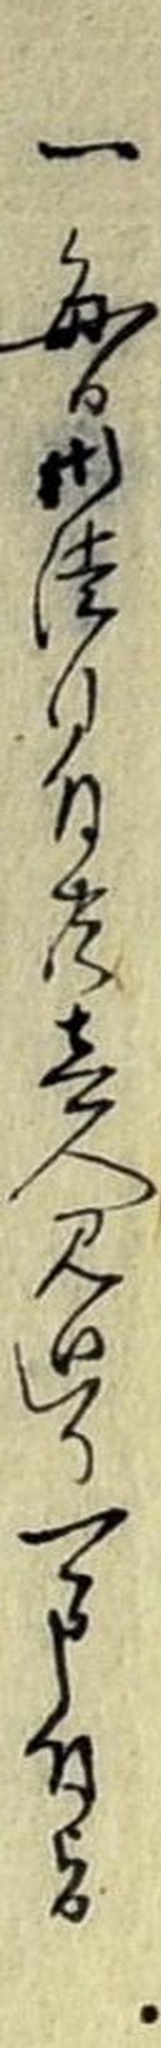一毎日御徒目付共壱人見廻り可申付旨
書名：命令之部 二
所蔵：福井県文書館 Fukui Prefectural Archives
